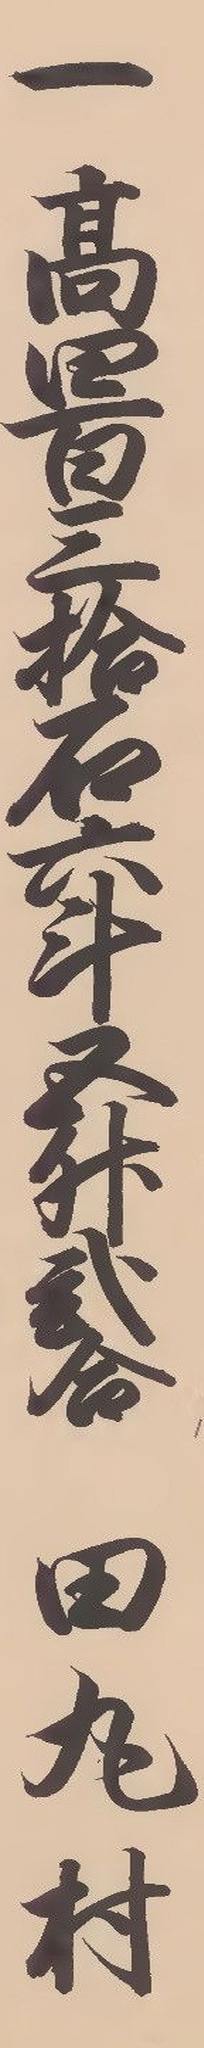一髙四百三拾石六斗五升弐合田丸村
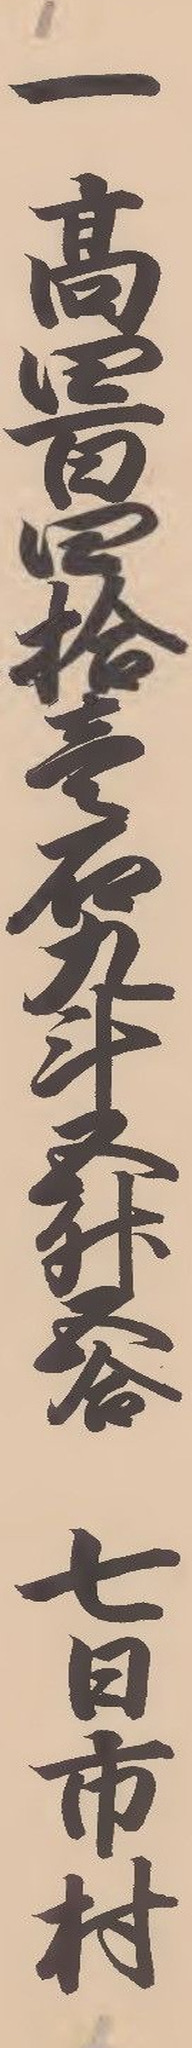一髙四百四拾壱石九斗五升五合七日市村
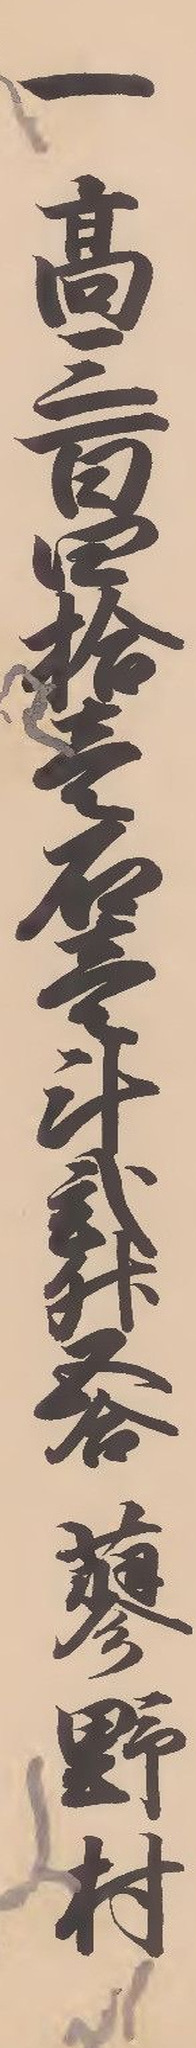一髙三百四拾壱石壱斗弐升五合蓼野村

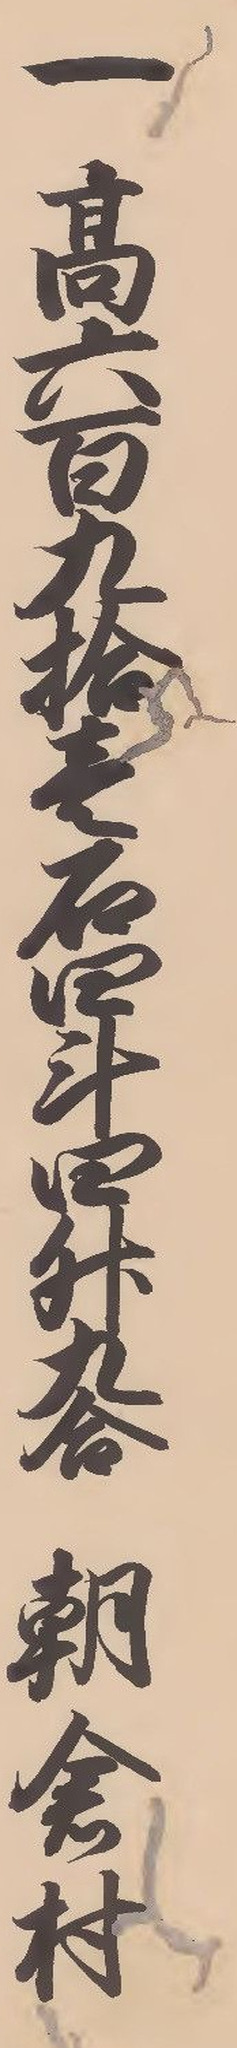一髙六百九拾壱石四斗四升九合朝倉村
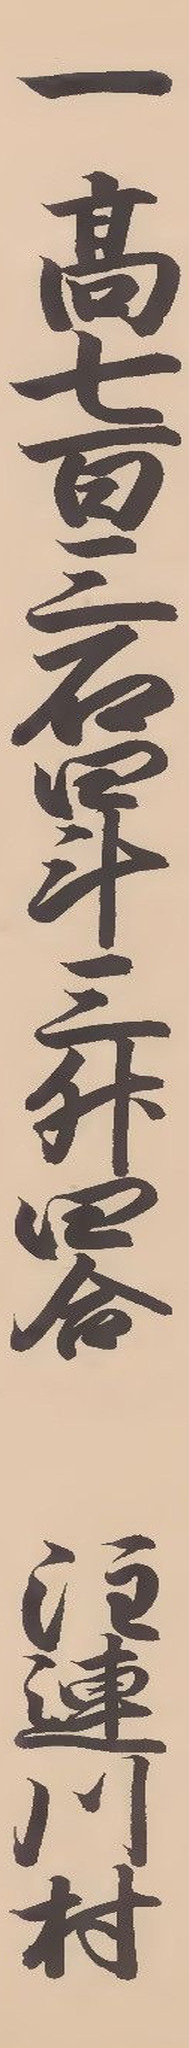一髙七百三石四斗三升四合注連川村
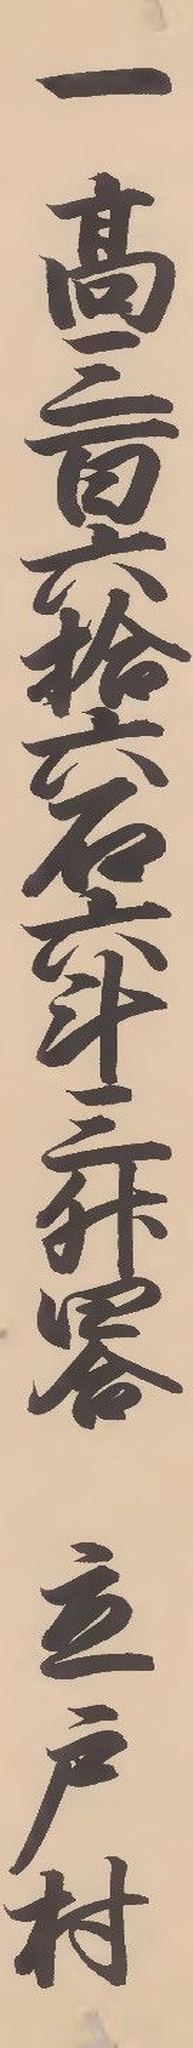一髙三百六拾六石六斗三升四合立戸村
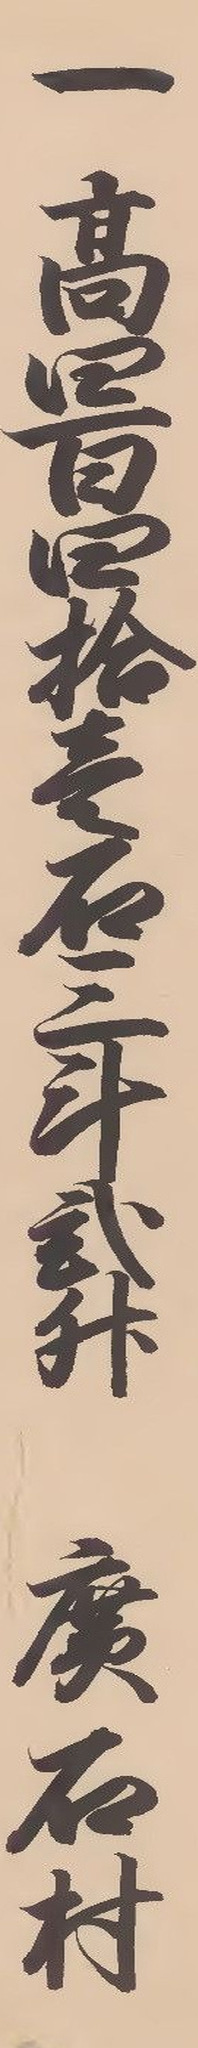一髙四百四拾壱石三斗弐升廣石村
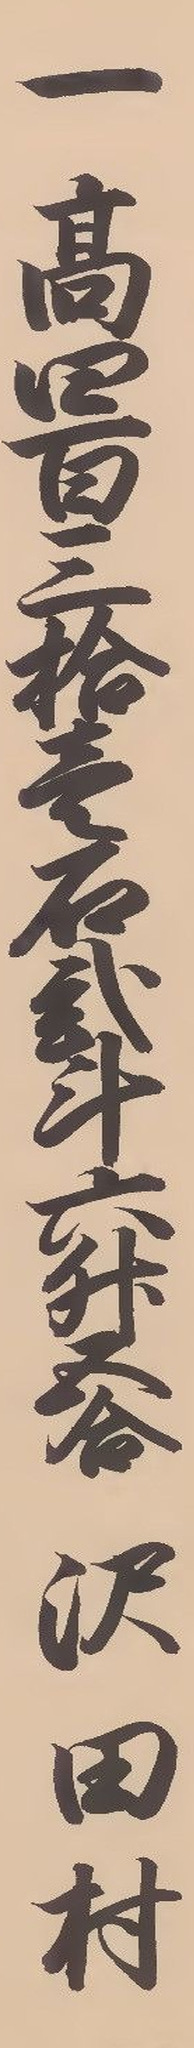一高四百三拾壱石弐斗六升五合沢田村
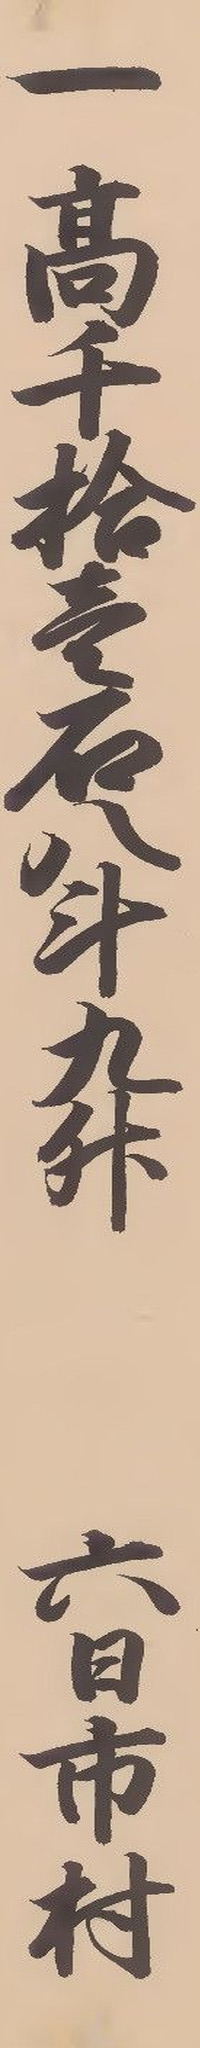一髙千拾壱石八斗九升六日市村
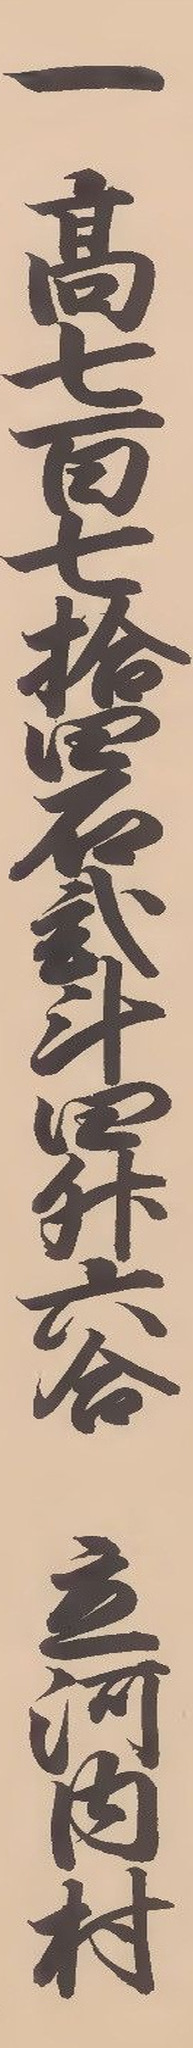一髙七百七拾四石弐斗四升六合立河内村
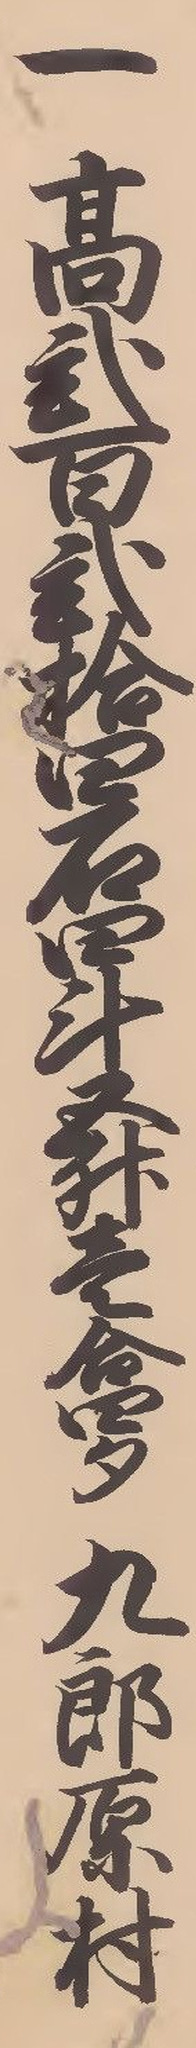一髙弐百弐拾四石四斗五升壱合四夕九郎原村

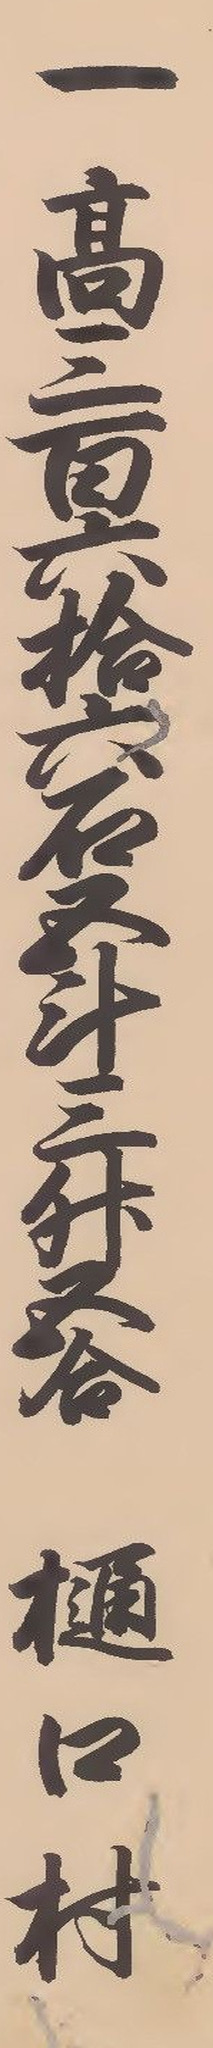一髙三百六拾六石五斗三升五合樋口村
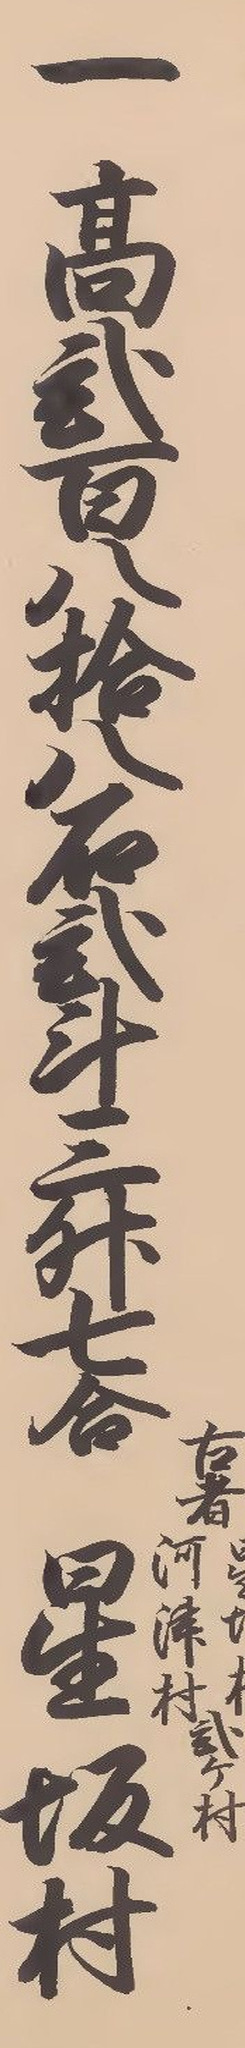一髙弐百八拾八石弐斗三升七合星坂村
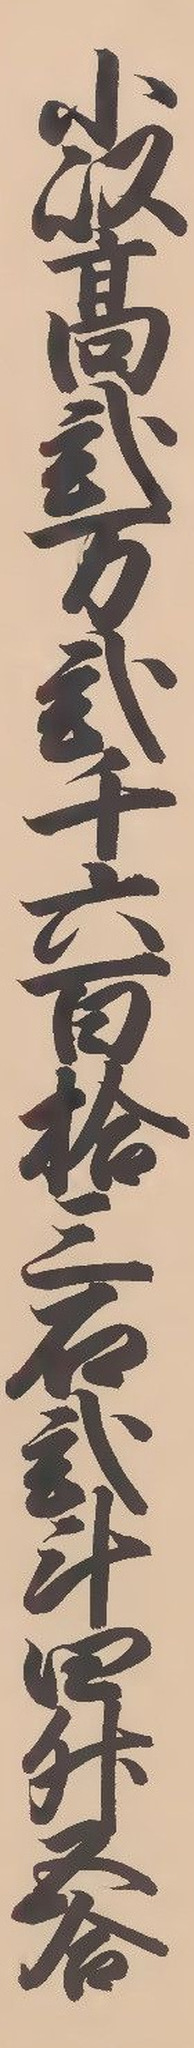小以髙弐万弐千六百拾三石弐斗四升五合
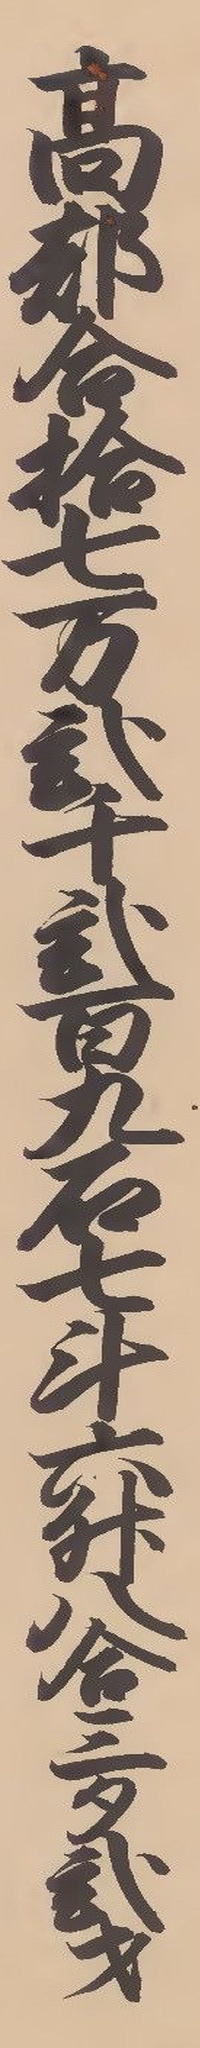髙都合拾七万弐千弐百九石七斗六升八合三夕弐才
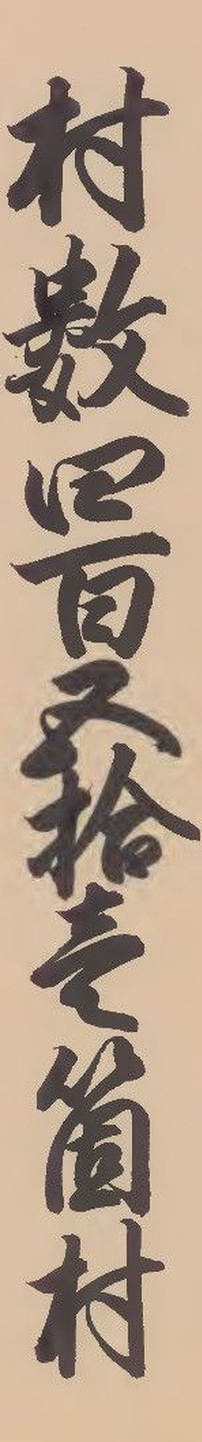村數四百五拾壱箇村
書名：石見国郷帳
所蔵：国立公文書館 National Archives of Japan
